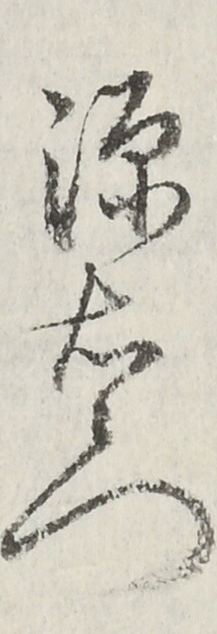源右衛門
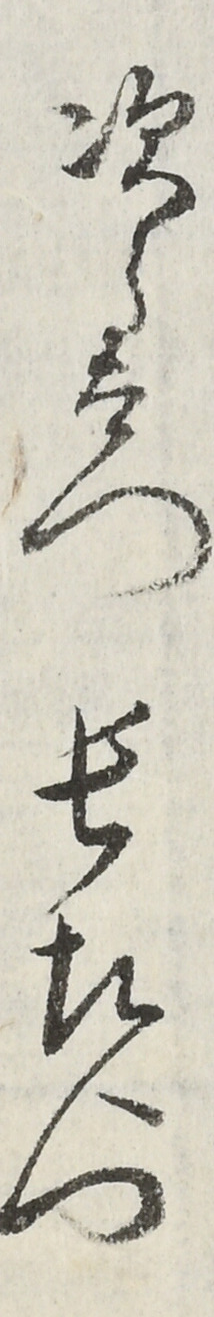次郎右衛門長左衛門
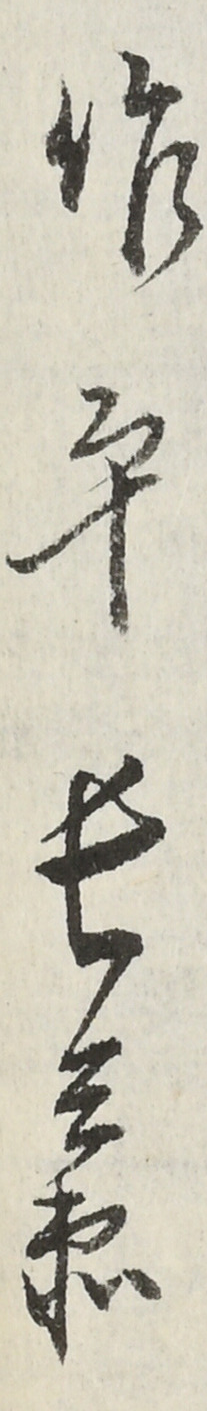作平長兵衛
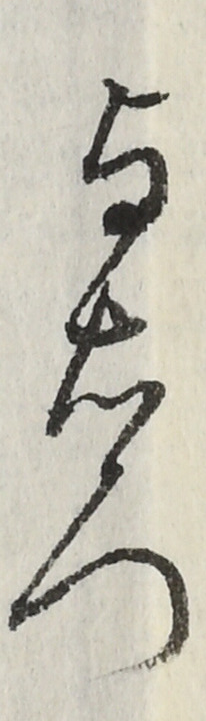源右衛門
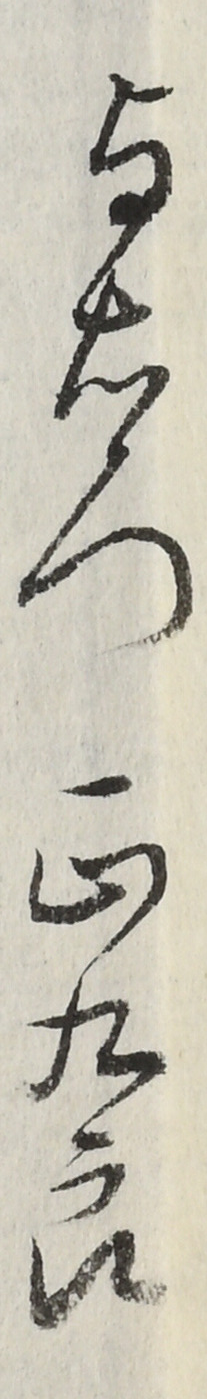与右衛門正九郎
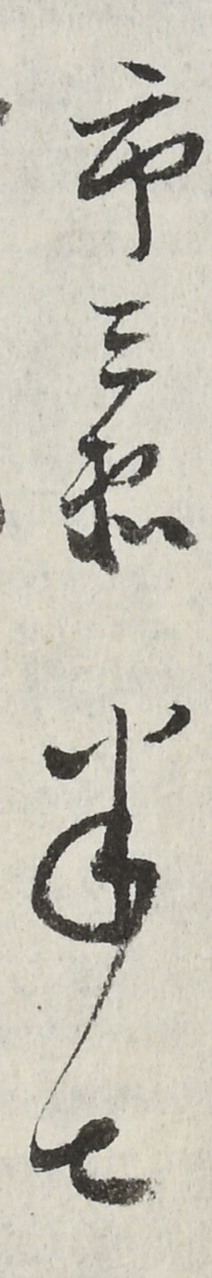市兵衛半七
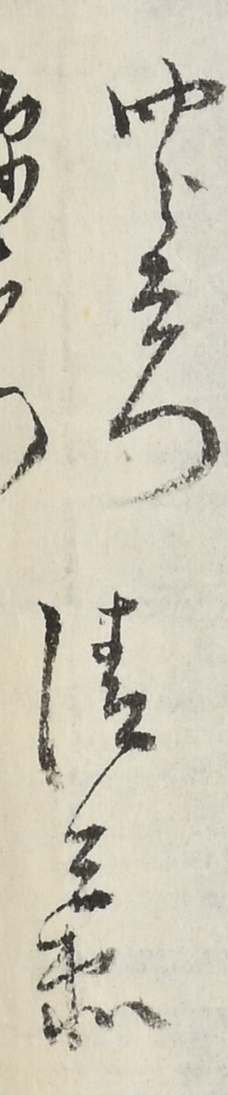四郎右衛門清兵衛
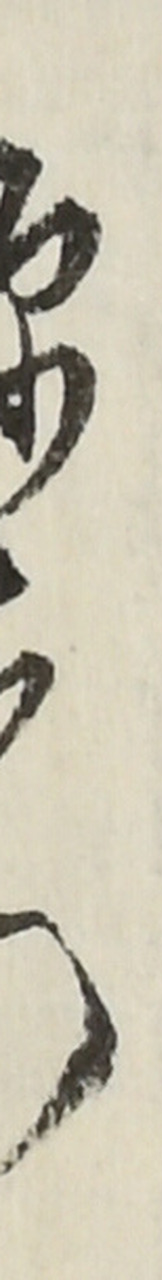源右衛門

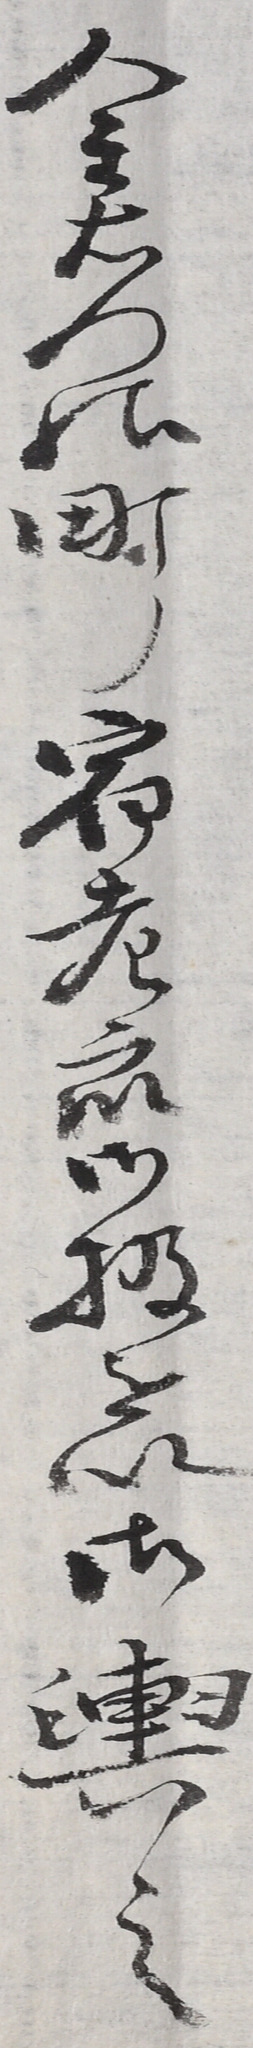金右衛門様町ノ宿老衆御扱を以御輿之
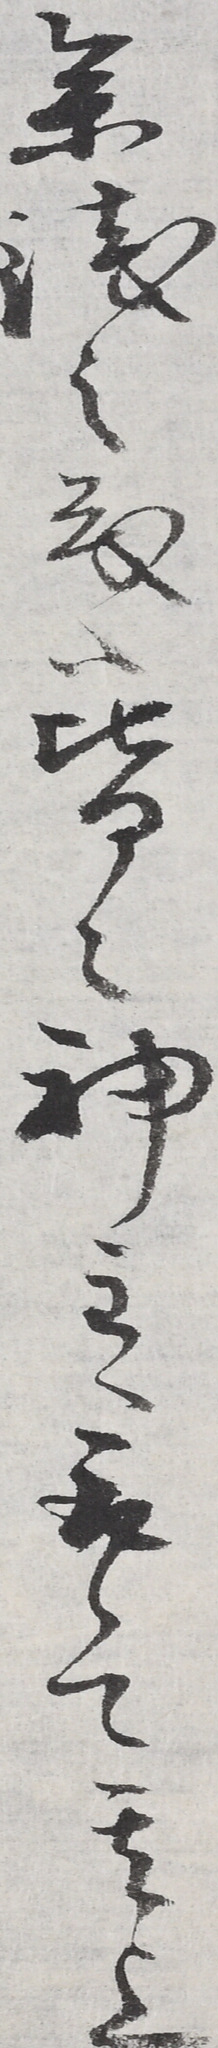参銭之義ハ皆々神主へ取候ハヽ其上
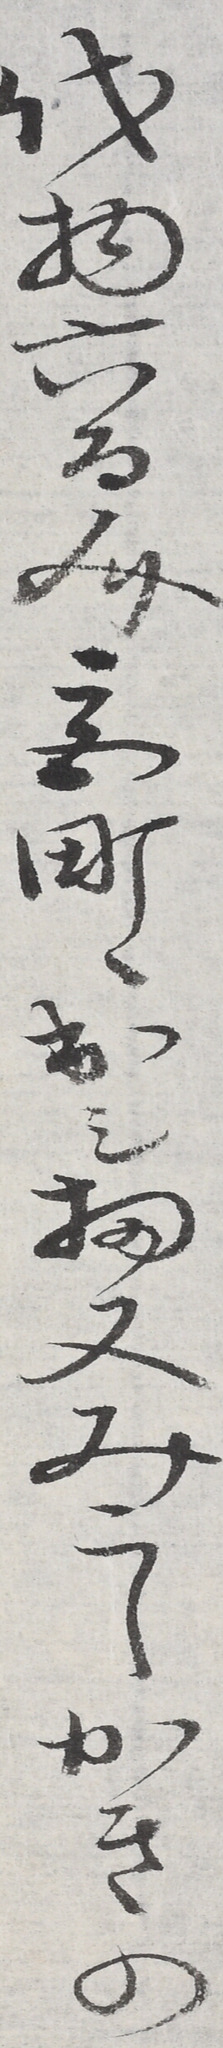代物六百文宮町へ出シ扨又みこしかきの
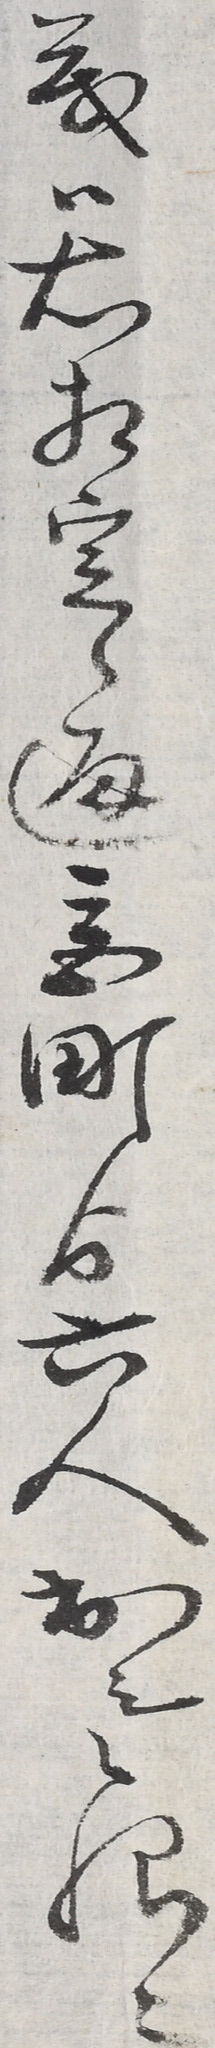義ハ右相定候通宮町ゟ六人出シ候様ニ
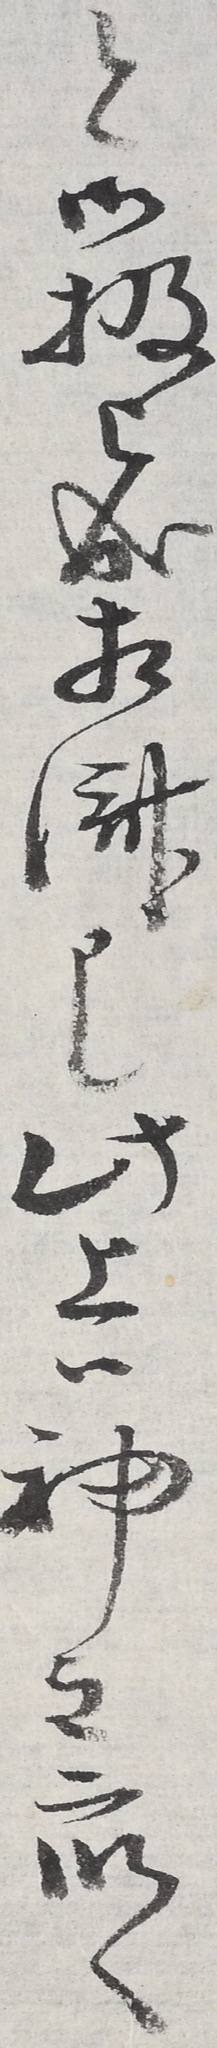と御扱被成相済申候此上ハ神主衆へ
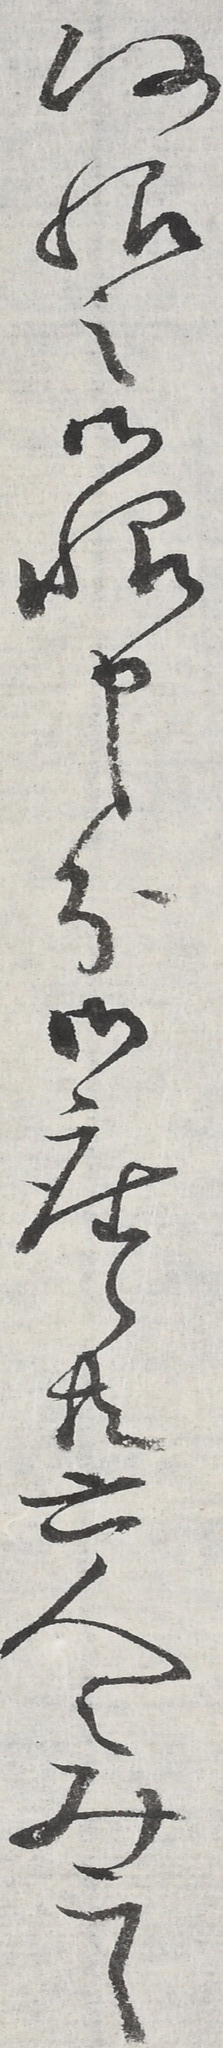何様之御恨申分御座候共六人之みこし
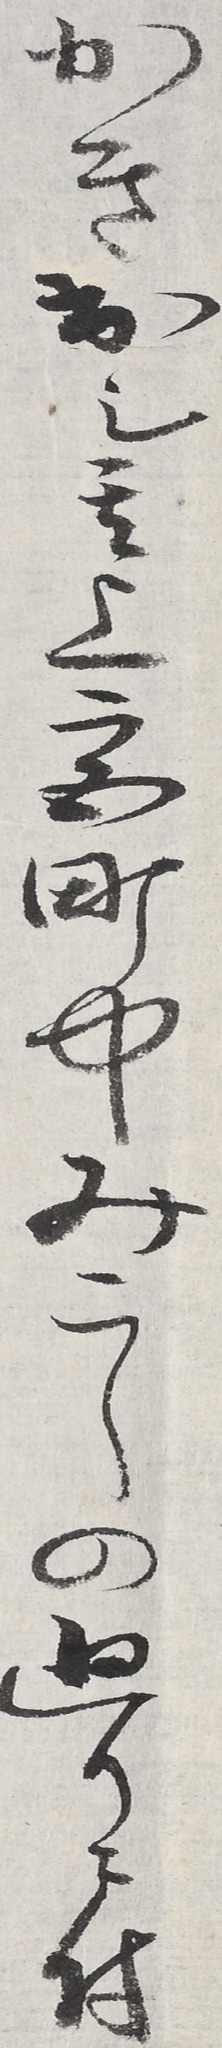かき出シ其上宮町中みこしの廻りニ付
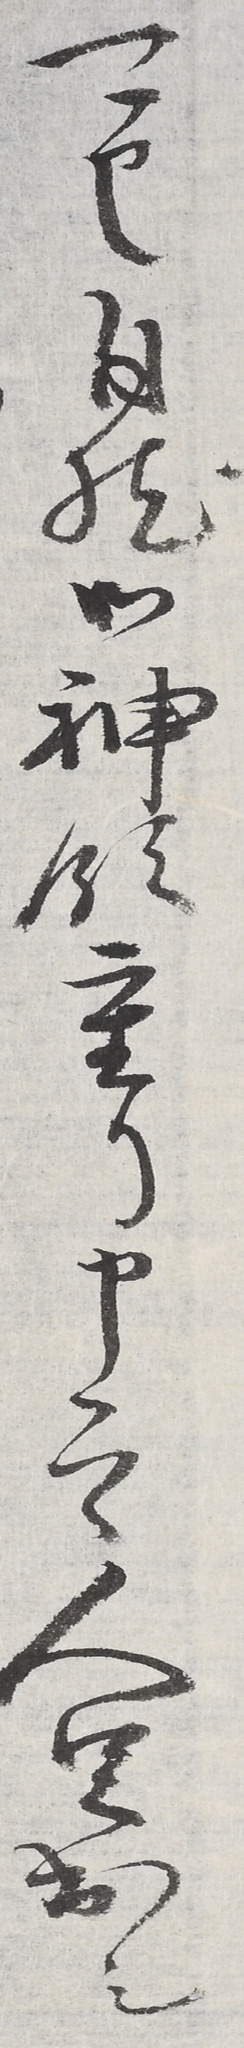可申候自然御神領重り申候ハヽ人足出シ
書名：旧記
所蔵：伊那市立高遠町図書館・合同会社AMANE
